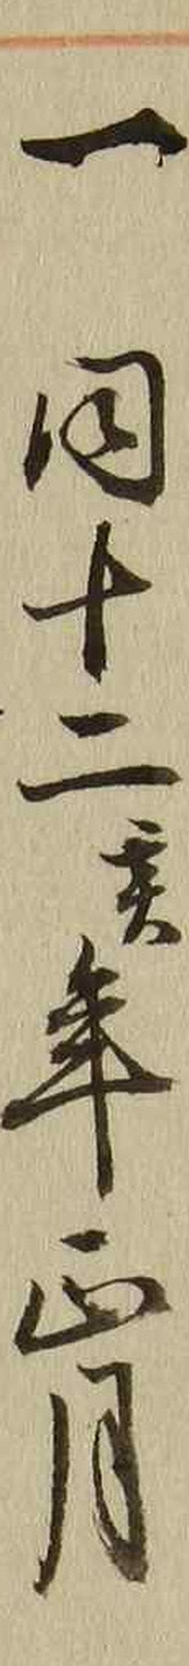一同十二亥年正月
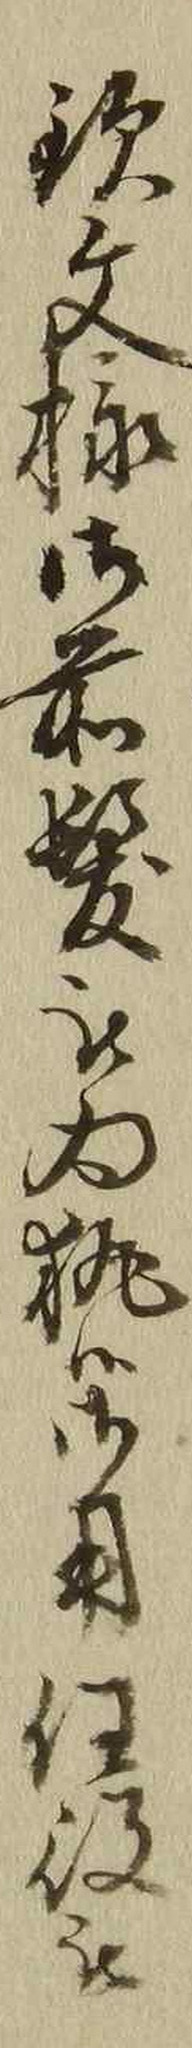欽文様御前髪被為執候御用任役被
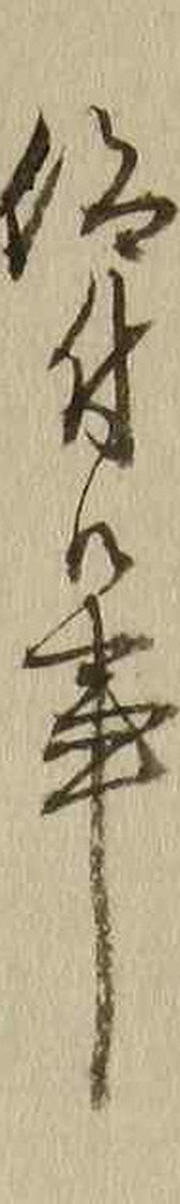仰付候事
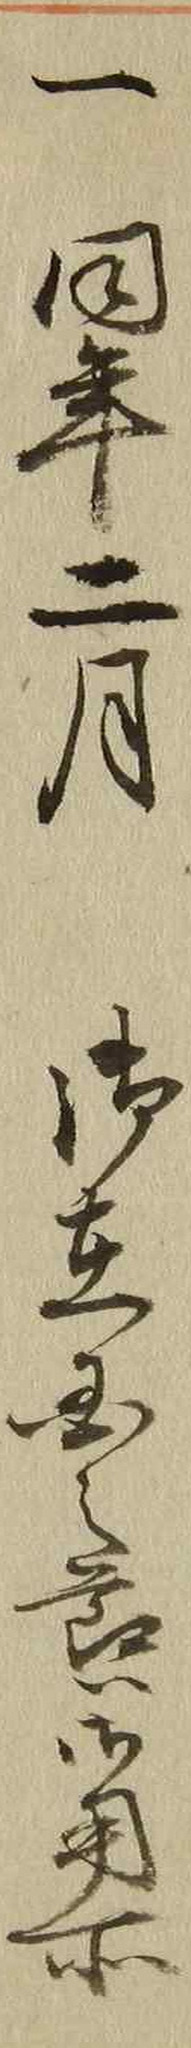一同年二月御在国之節御用所
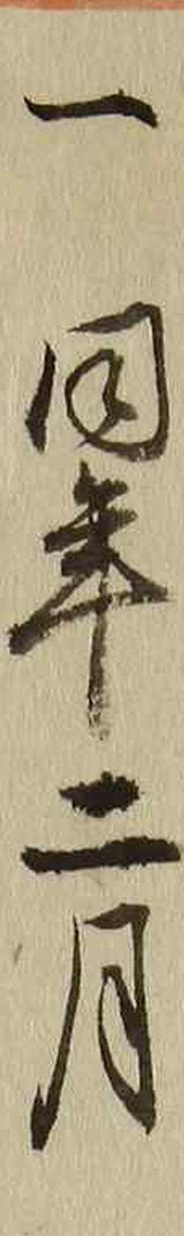一同年十月
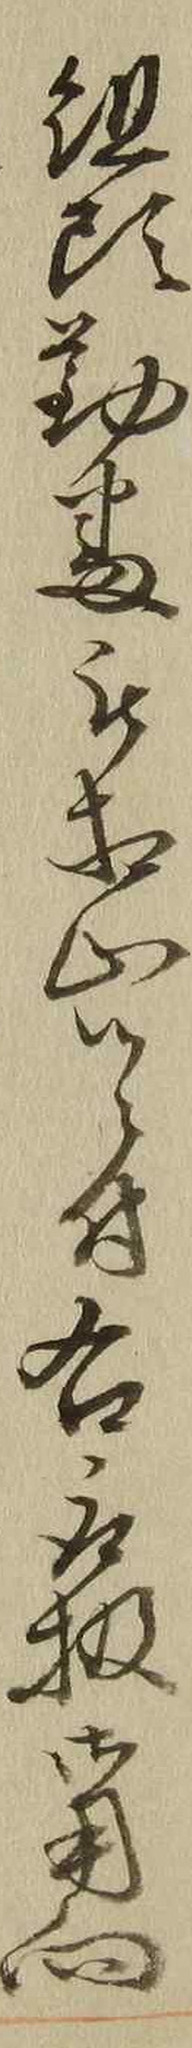組頭勤番被相止候ニ付右取扱御用向
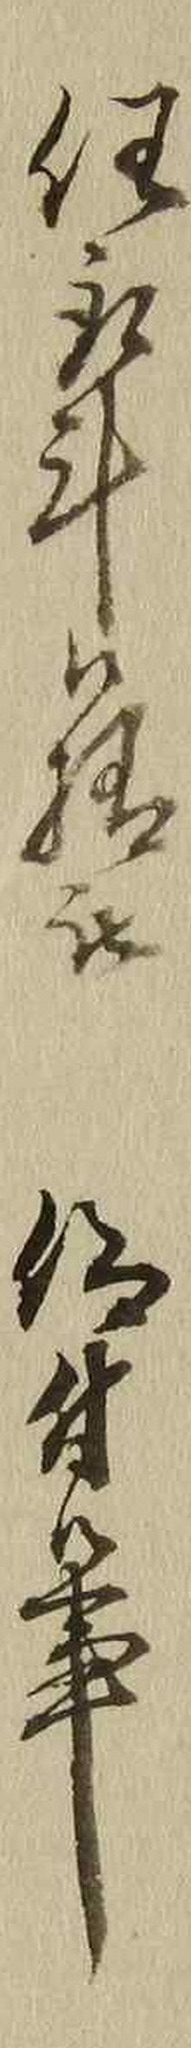任取斗候様被仰付候事
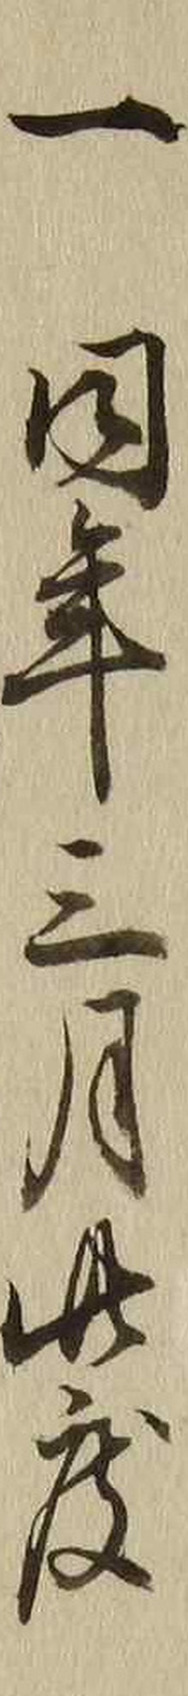一同年三月此度
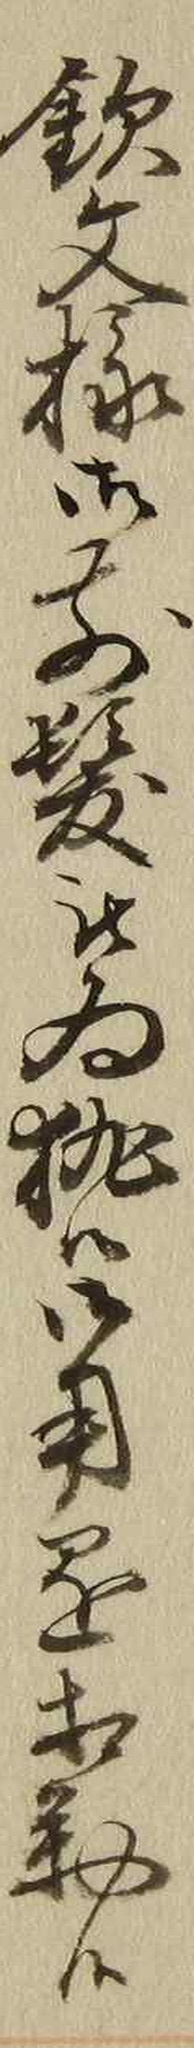欽文様御前髪被為執候御用懸相勤候
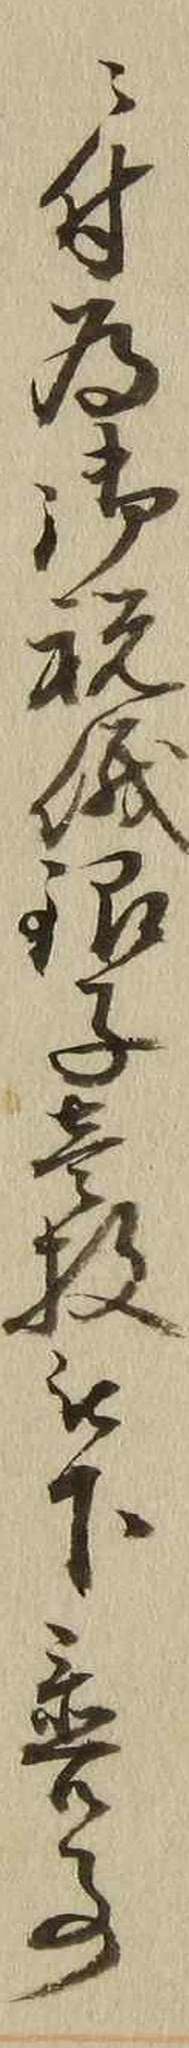ニ付為御祝儀銀子壱枚被下置候事
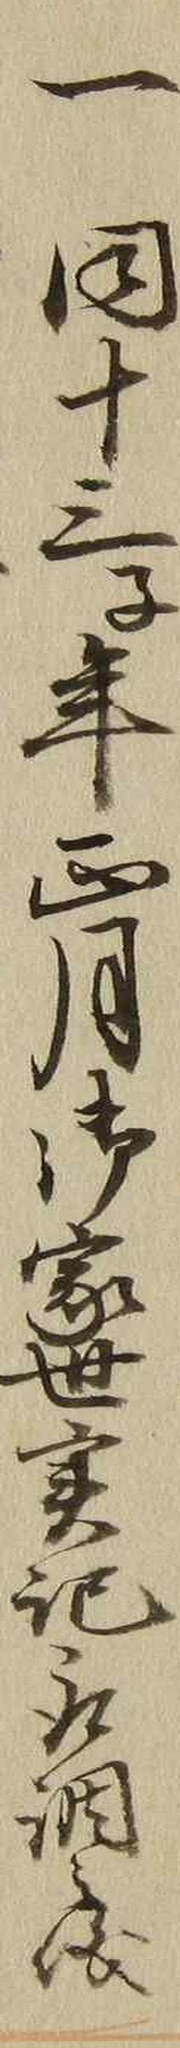一同十三子年正月御家世実記取調候儀
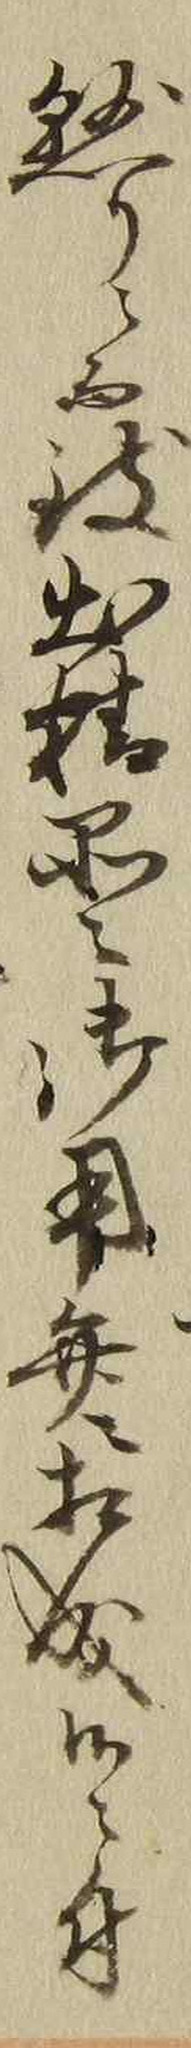懸りニ而致出精品々御用弁ニ相成候ニ付
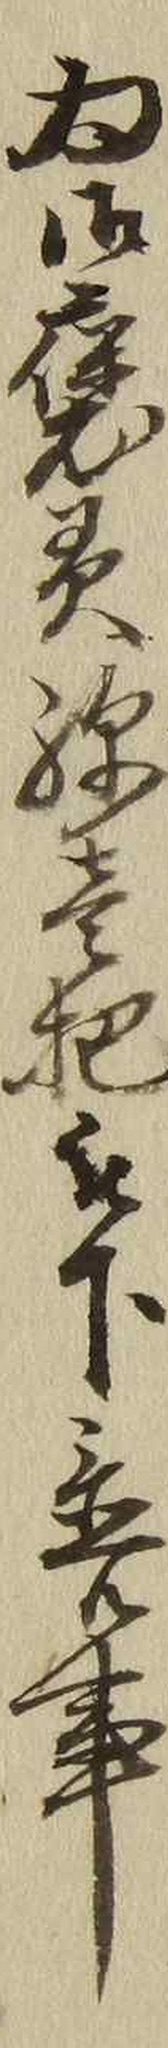為御褒美綿壱把被下置蒙
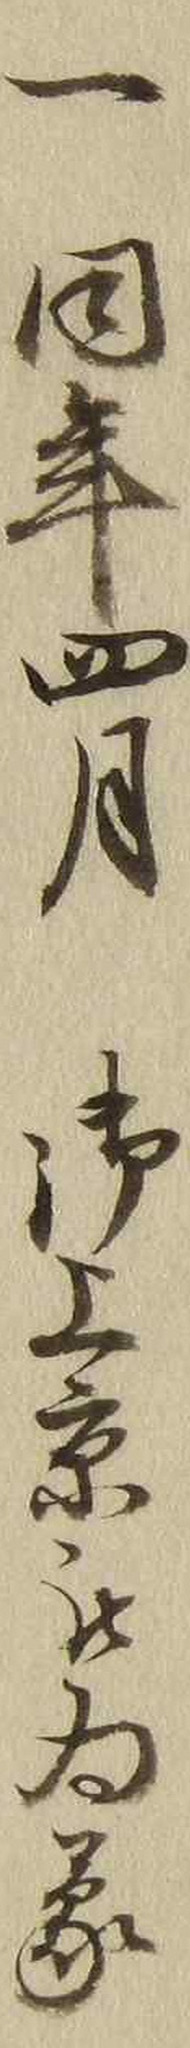一同年四月御上京被為蒙
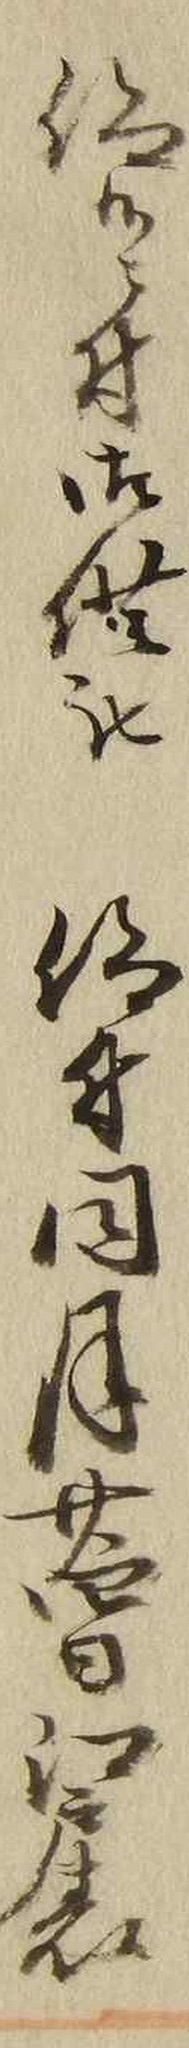仰候ニ付御供被仰付同月廿四日江戸表

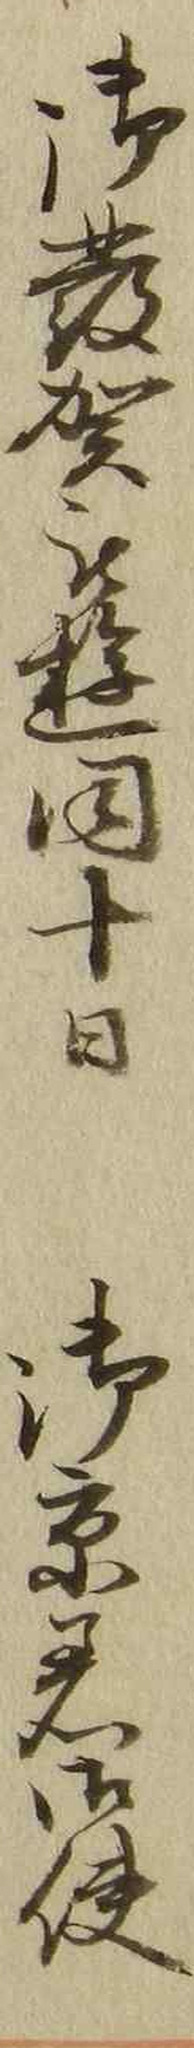御発駕被遊同十日御京着御使
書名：諸士系譜　巻之64　と之部7
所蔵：会津若松市立会津図書館
